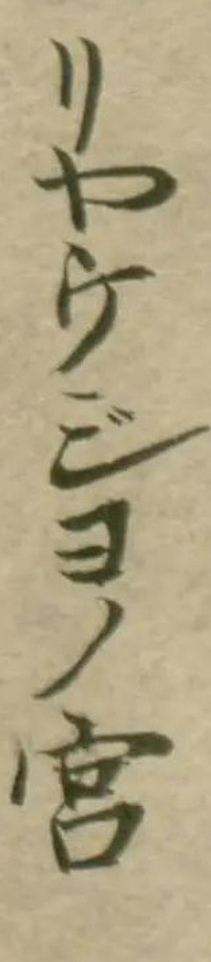リヤウジヨノ宮
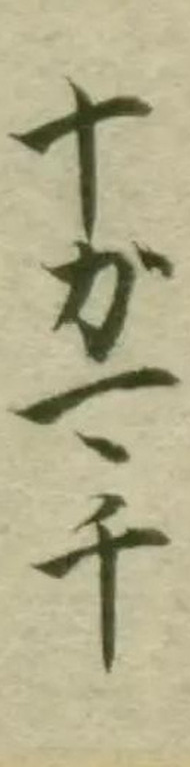ナガマチ
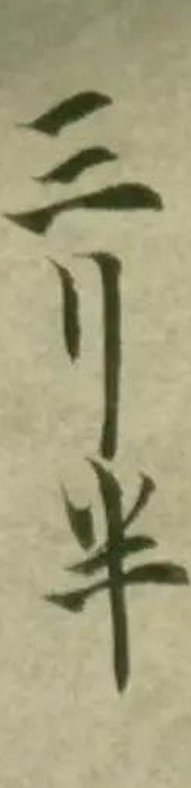三リ半
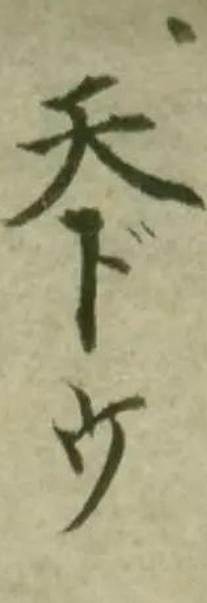天ドウ

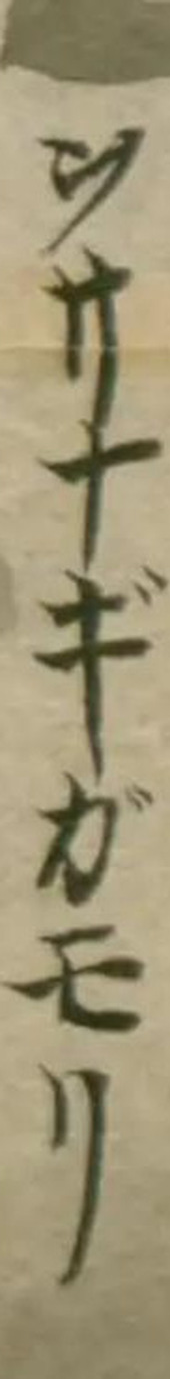ヲサナギガモリ
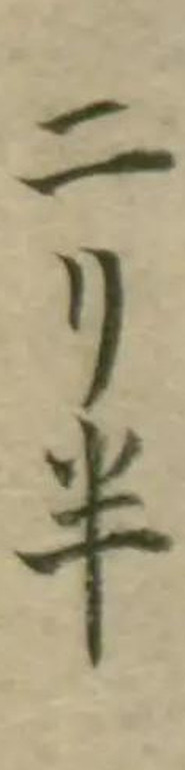二リ半
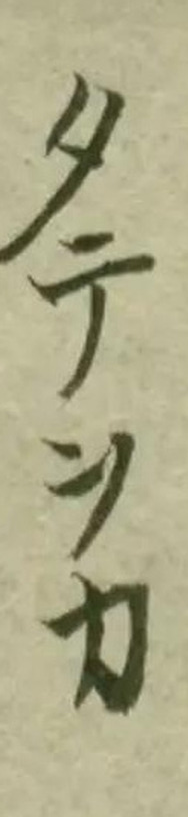タテヲカ

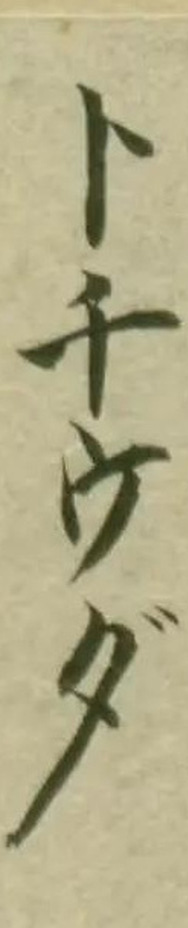トチウダ
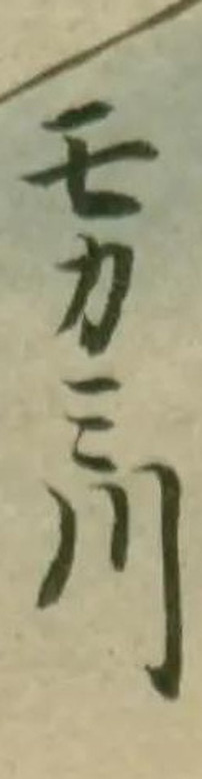モカミ川
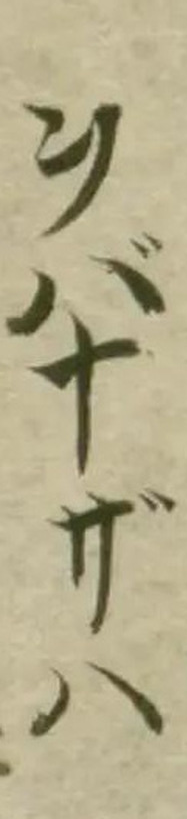ヲバナザハ

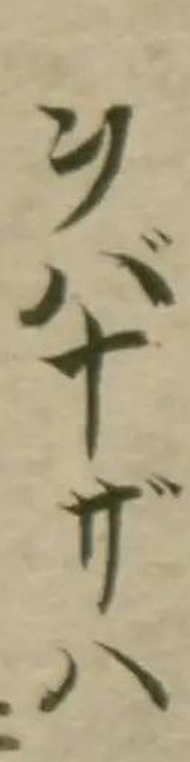ヲバナザハ
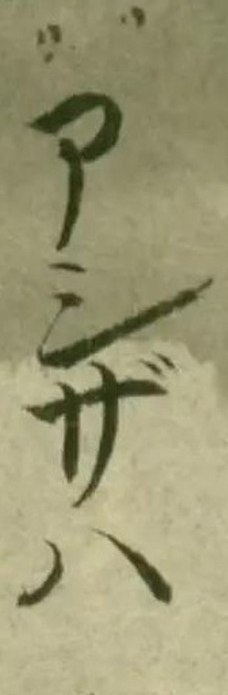アシザハ
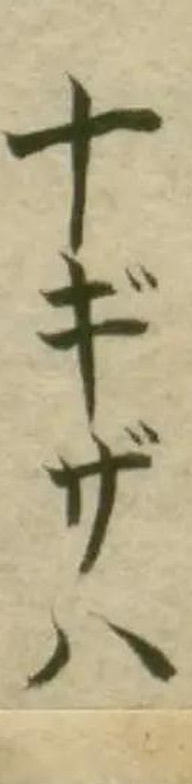ナギザハ
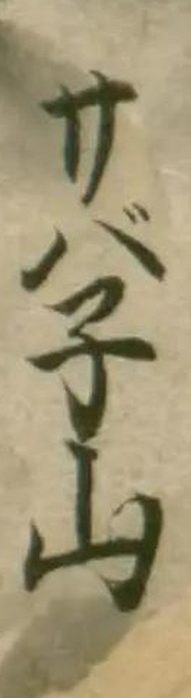サバネ山

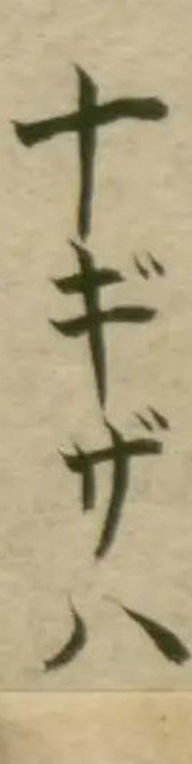ナギザハ
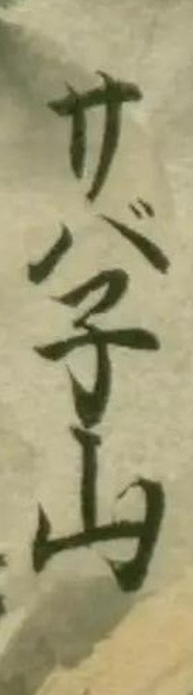サバネ山
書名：江戸より奥州津輕迄道筋之圖
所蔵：国立国会図書館 National Diet Library, JAPAN
